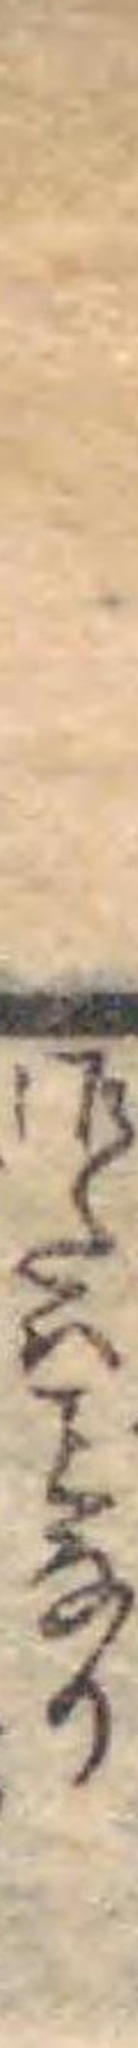御たはことなり
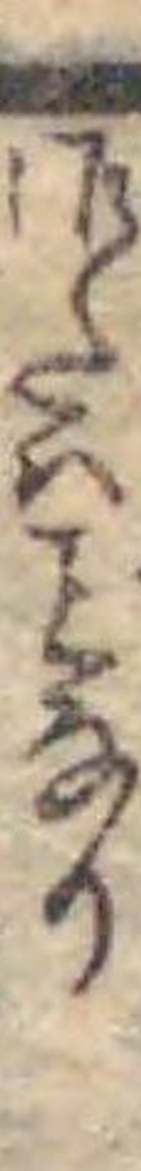御たはことなり
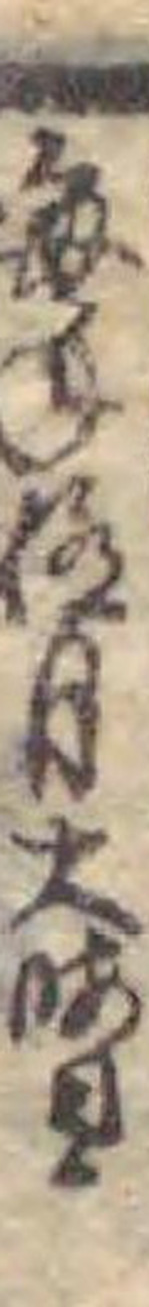毎年極月大晦日に
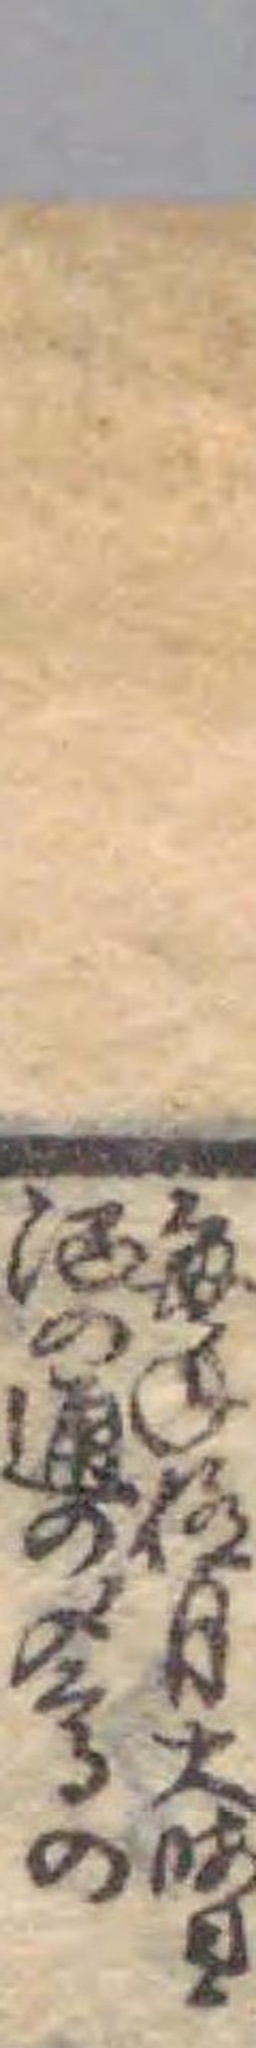酒の通の〆高の
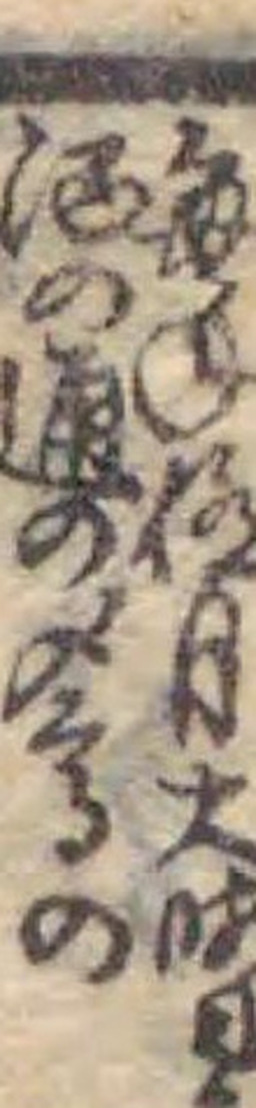酒の通の〆高の
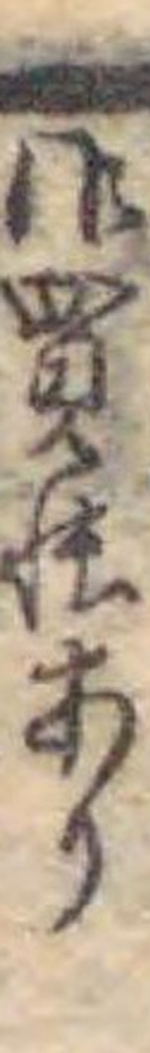御買帳あり
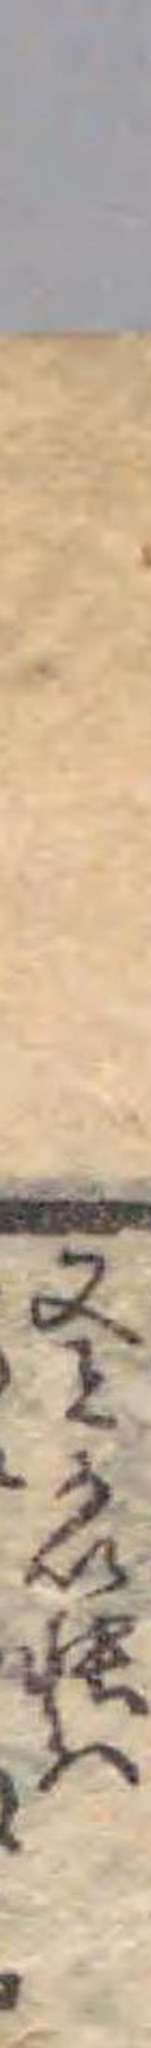又とかい帳は
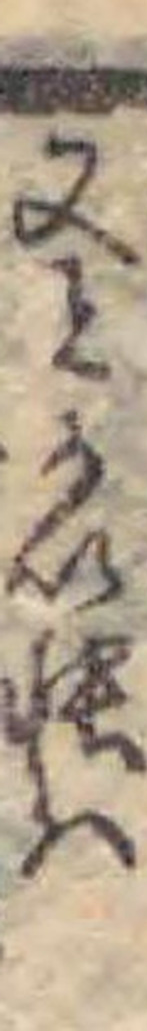又とかい帳は
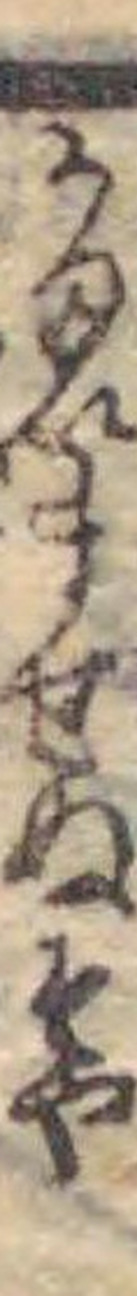かまいませぬそや
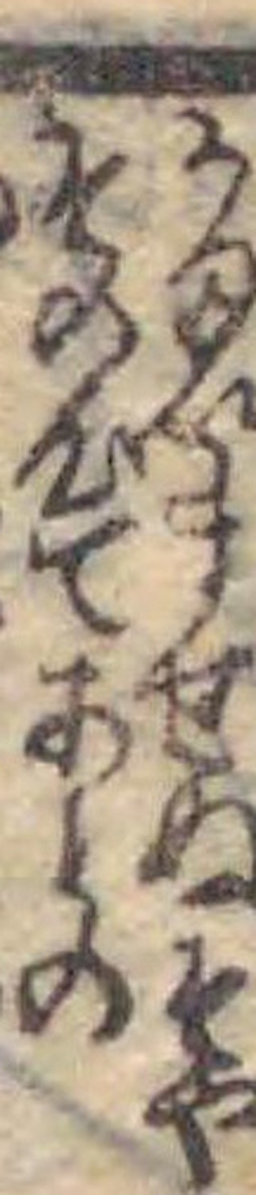その心てあとの
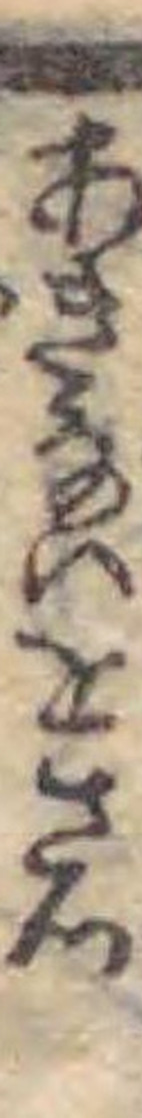あきないをさつ
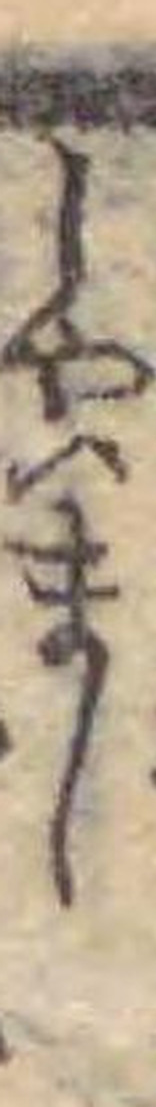しやいまし
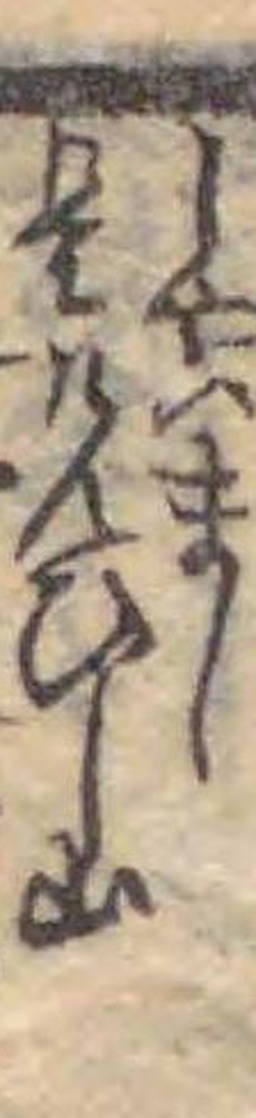是けんひし山
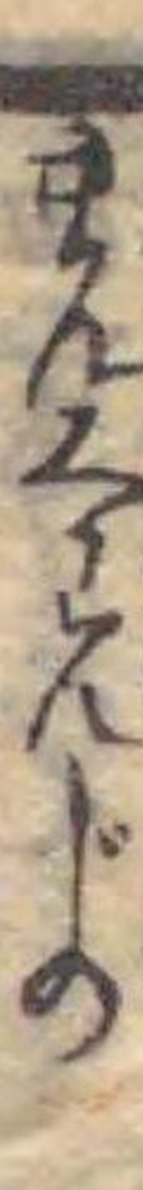まんくわんじの
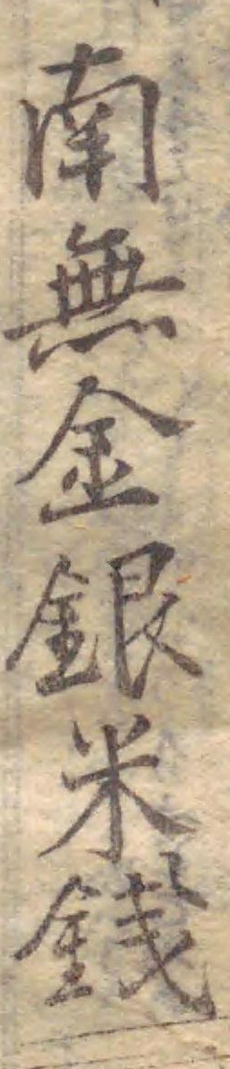南無金銀米銭
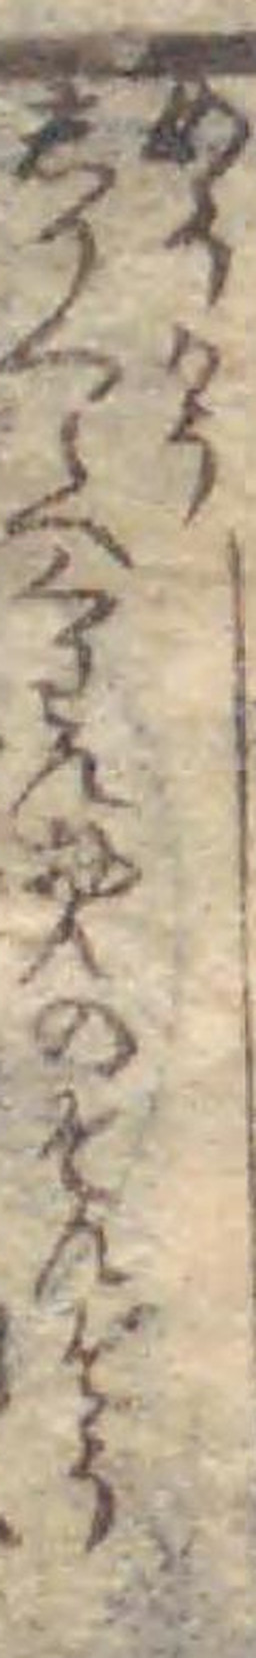しりくらへくわんおんのそんぞう
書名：身体開帳略縁起 : 3巻
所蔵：国立国会図書館 National Diet Library, JAPAN
